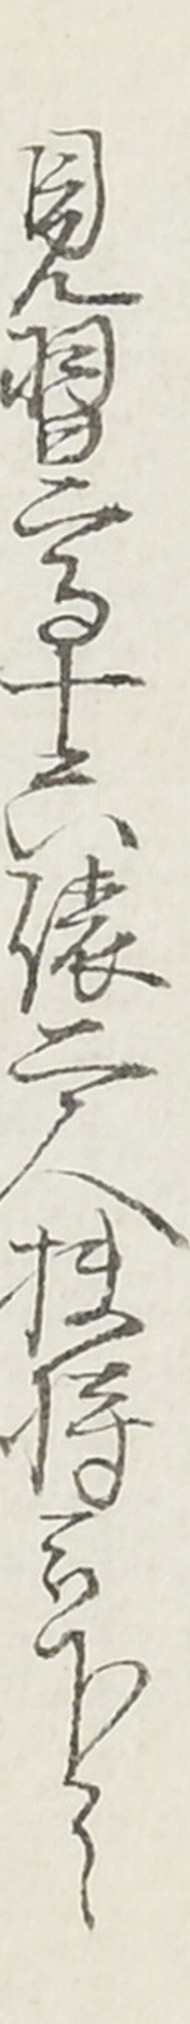見習高十六俵二人扶持被下之
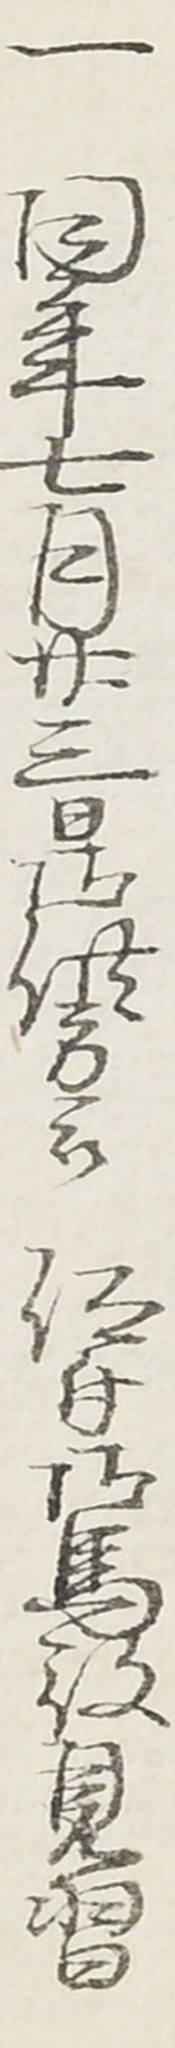一同年七月廿三日御供方被仰付御馬役見習
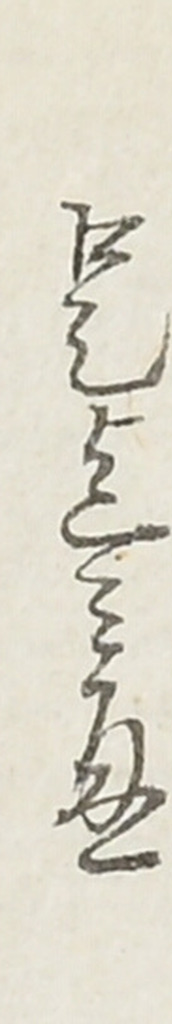是迄之通
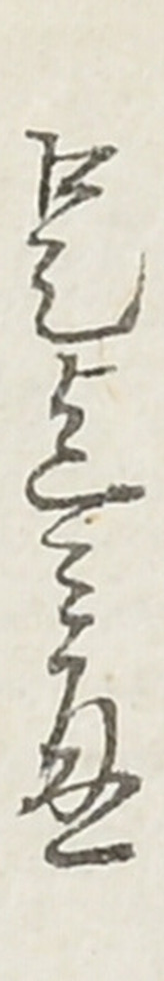是迄之通
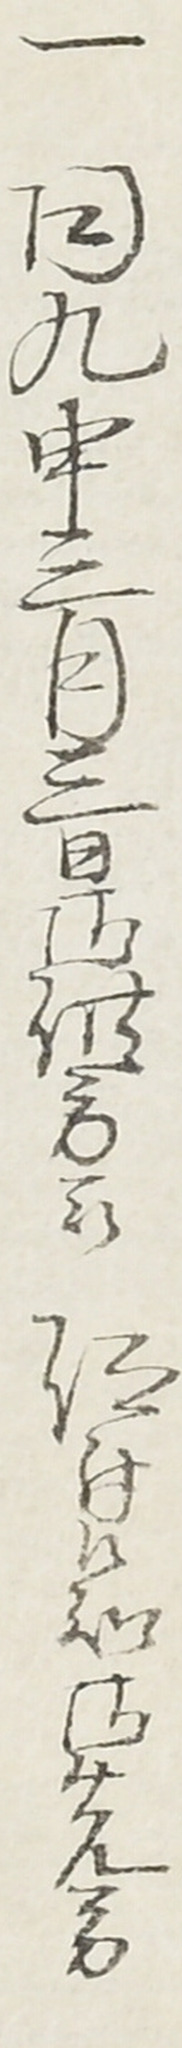一同九申三月三日御供方被仰付候処御先方
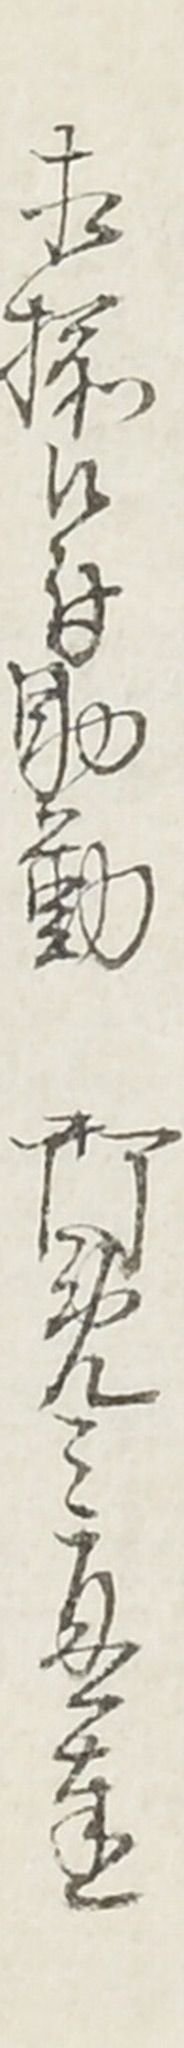相揃候付助勤御免之通達
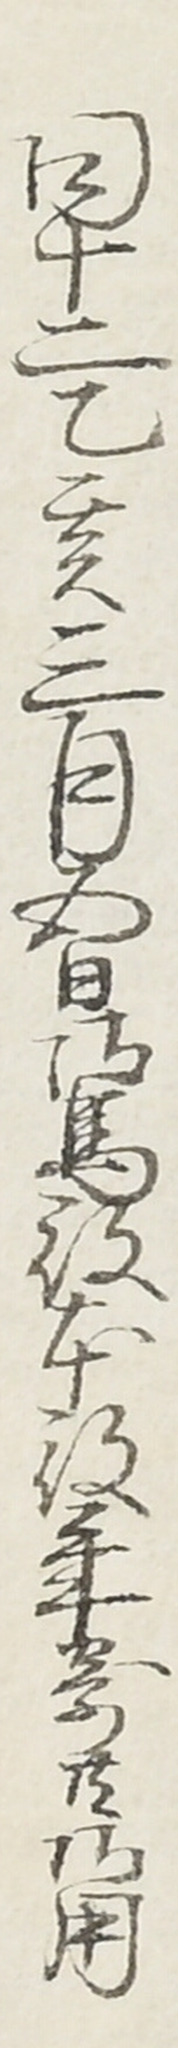一同十二乙亥三月五日御馬役本役年寄共御用
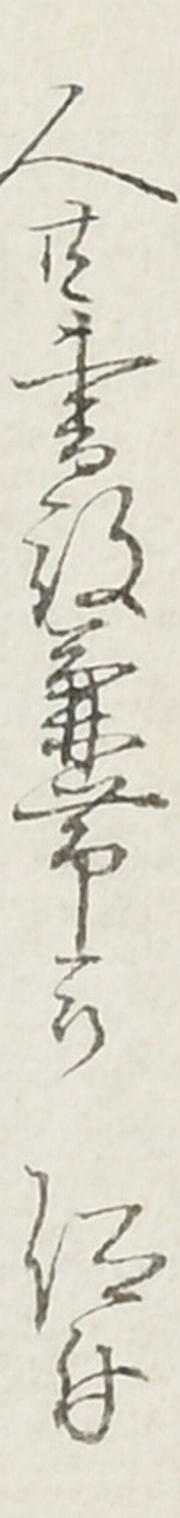人共書役兼帯被仰付
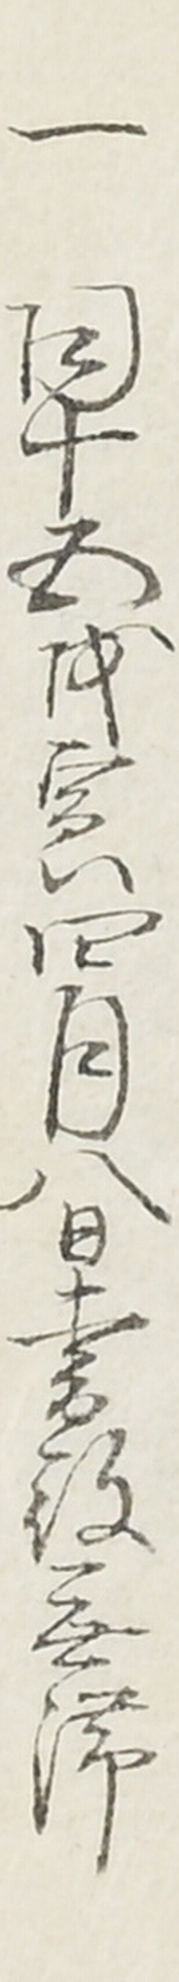一同十五戊寅四月八日書役無滞
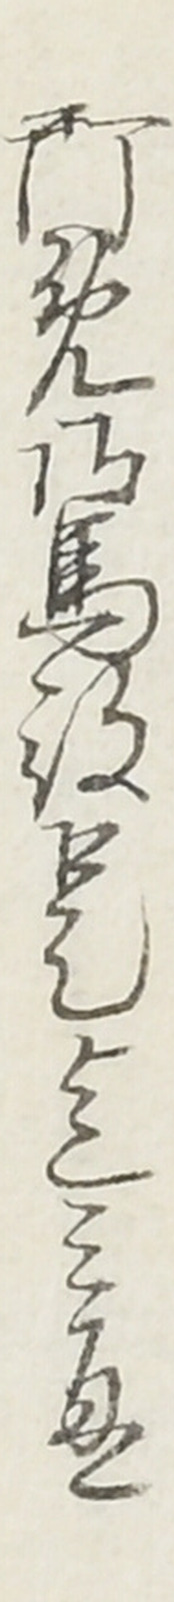御免御馬役是迄之通
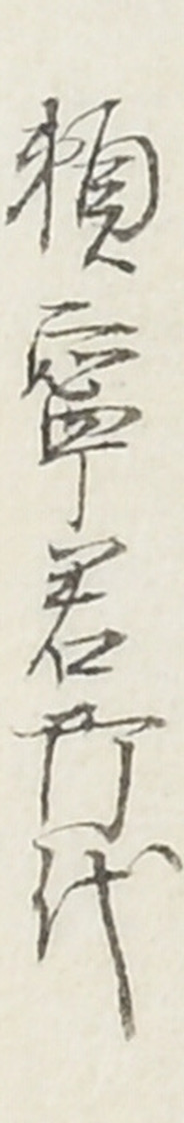頼寧君御代

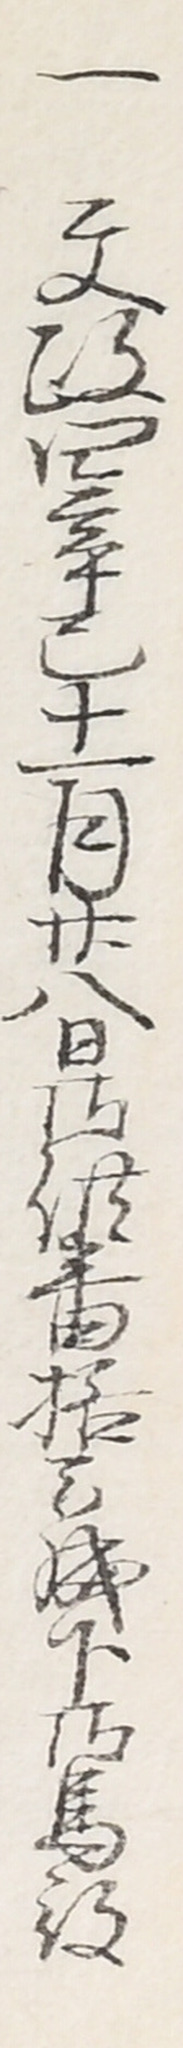一文政四辛巳十一月廿八日御供番格被成下御馬役
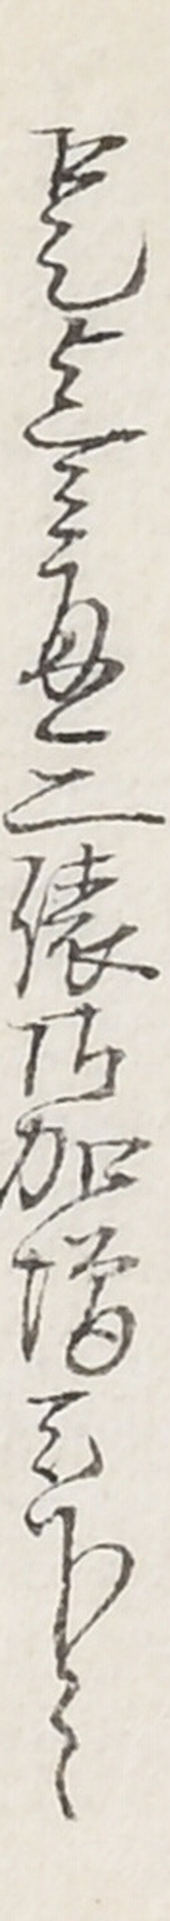是迄之通三俵御加増被下之
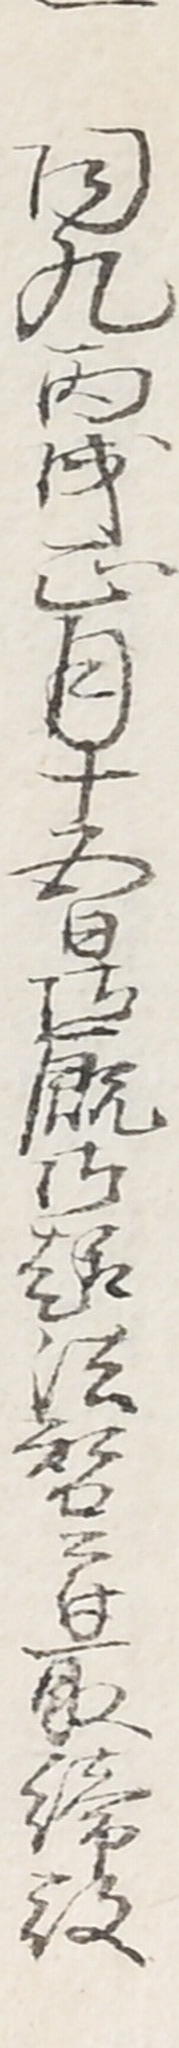一同九丙戌正月十五日御厩御趣法替ニ付取締役
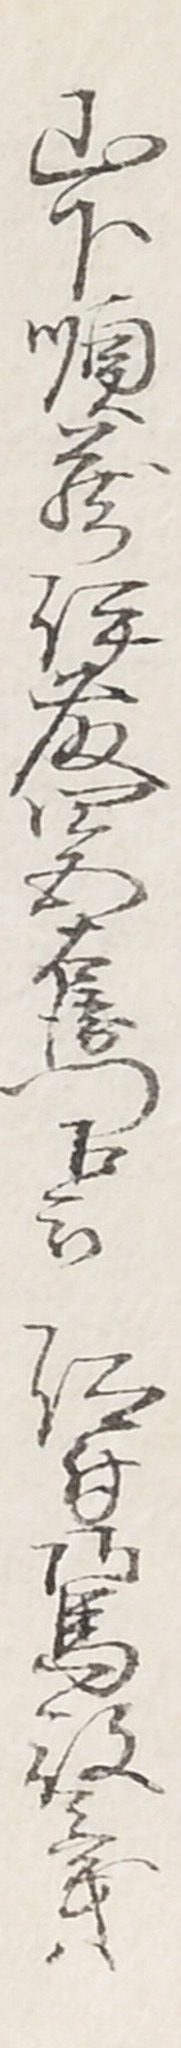山下順蔵伊藤志四五右衛門江被下之被仰付御馬役之義ハ
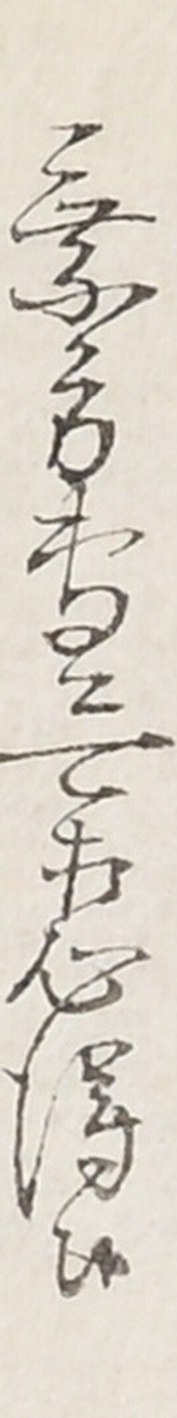乗方専ニ可相心得候
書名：無足諸士勤仕録（四）
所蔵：伊那市立高遠町図書館・合同会社AMANE
